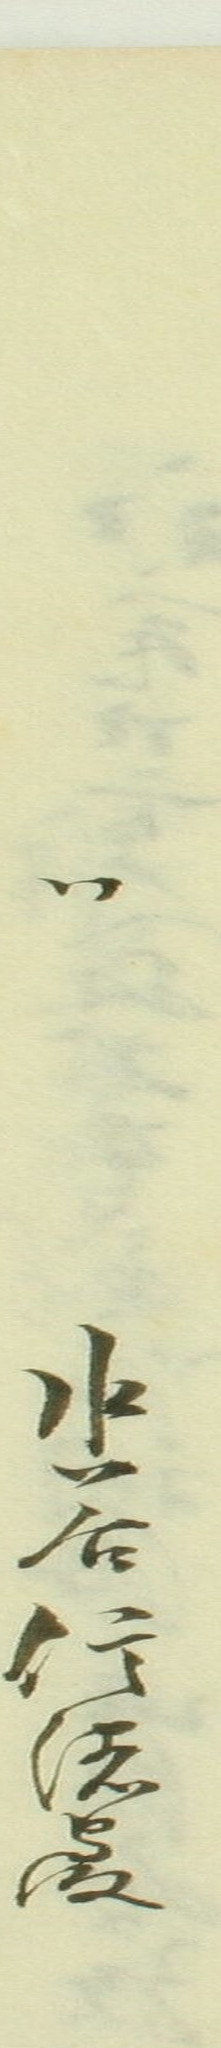同水谷信濃守殿
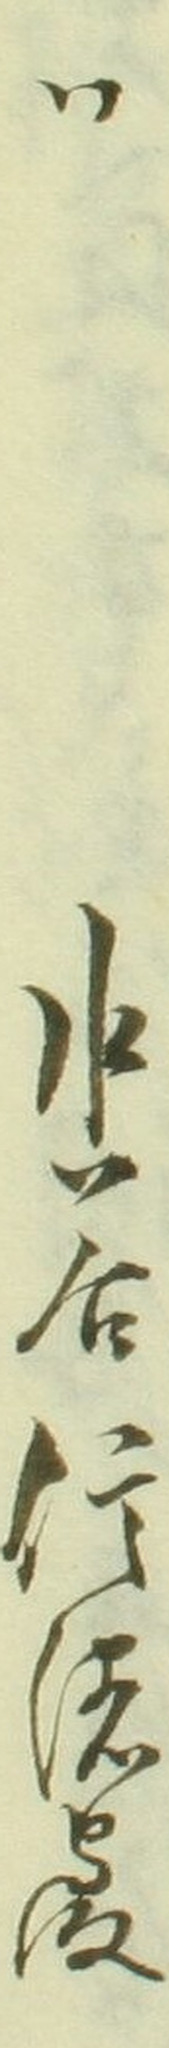同水谷信濃守殿
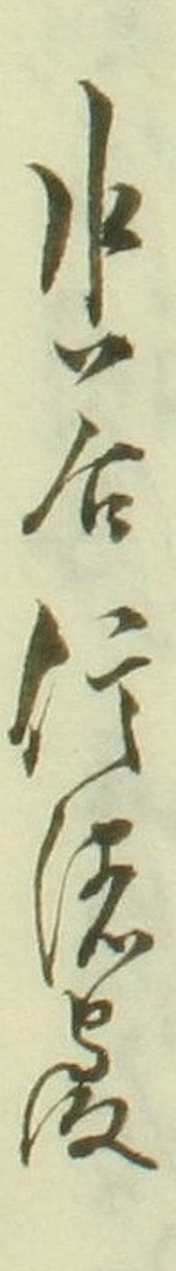同水谷信濃守殿
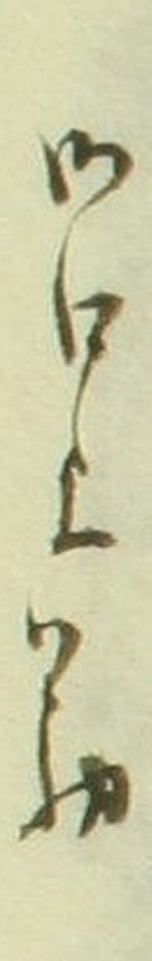御口上勤分
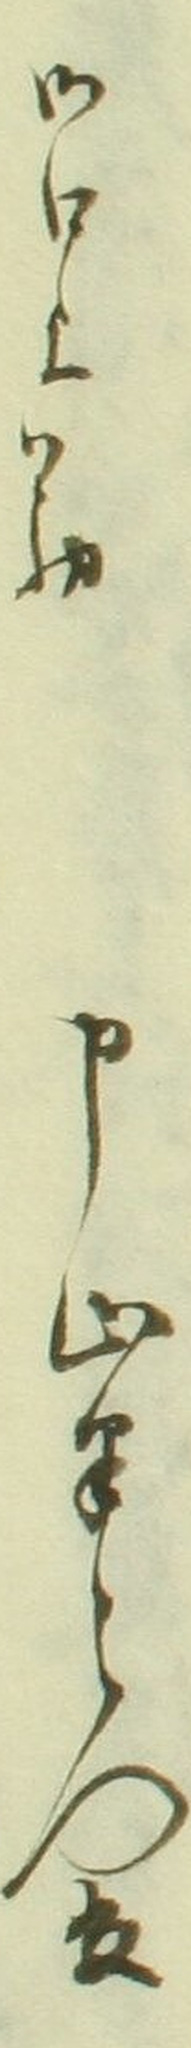御口上勤中山半右衛門殿
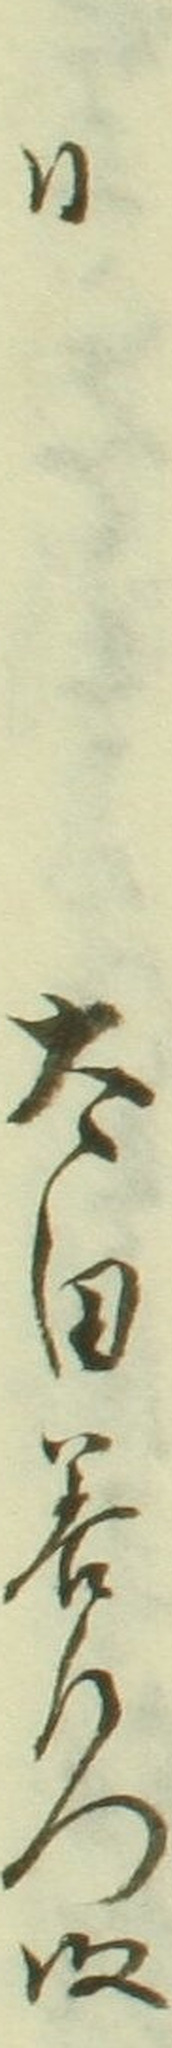同太田善右衛門殿
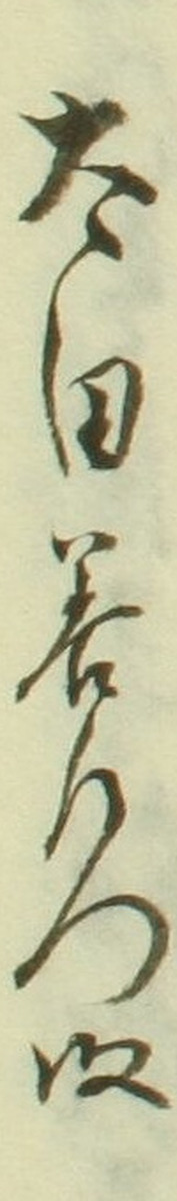同太田善右衛門殿

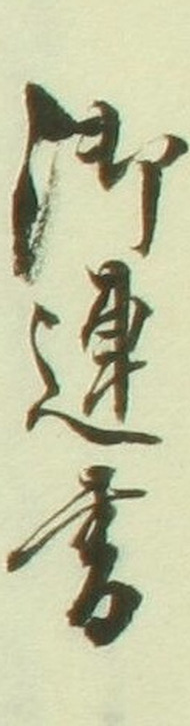御連書
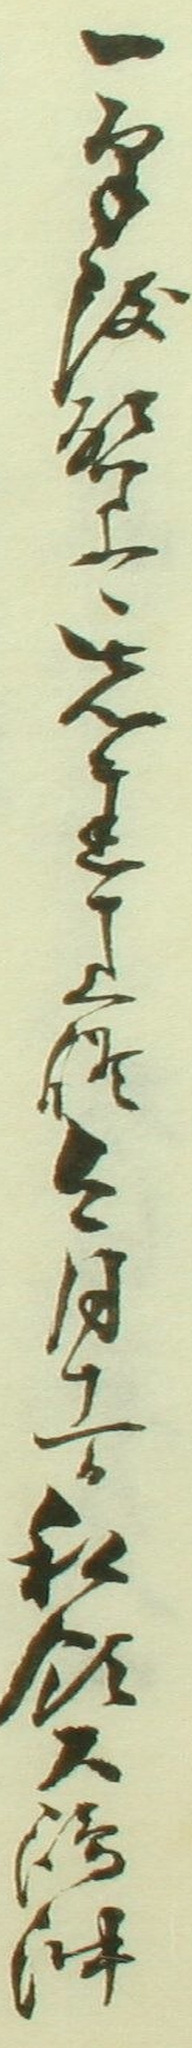一筆致啓上先達申上候今月十一日私領大嶋沖
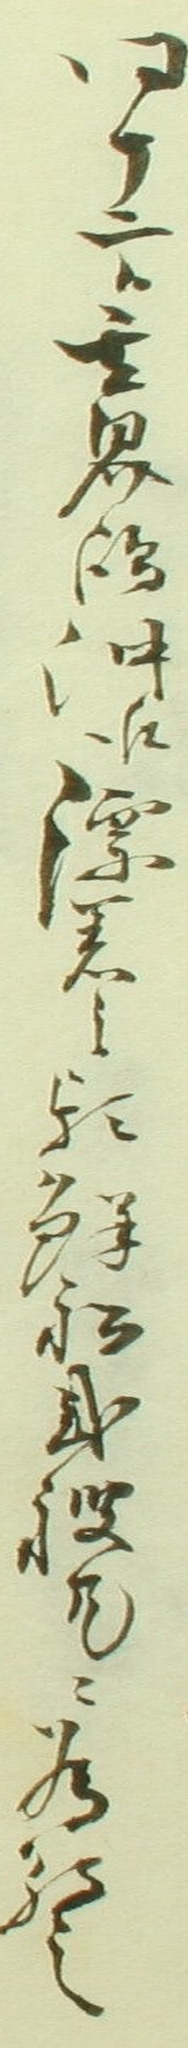同十二日玄界嶋沖江漂着之朝鮮船弐艘共ニ為警
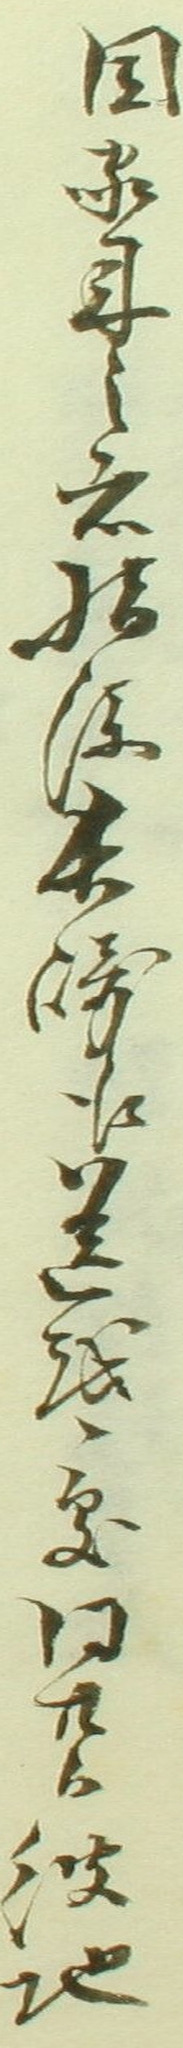固家来之者指添長崎江送越候処同廿日彼地
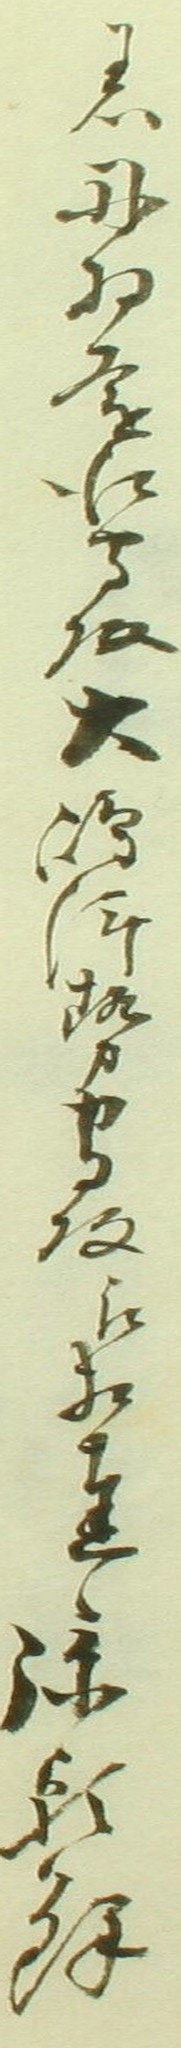着丹羽遠江守殿大嶋伊勢守殿江相達候弥朝鮮
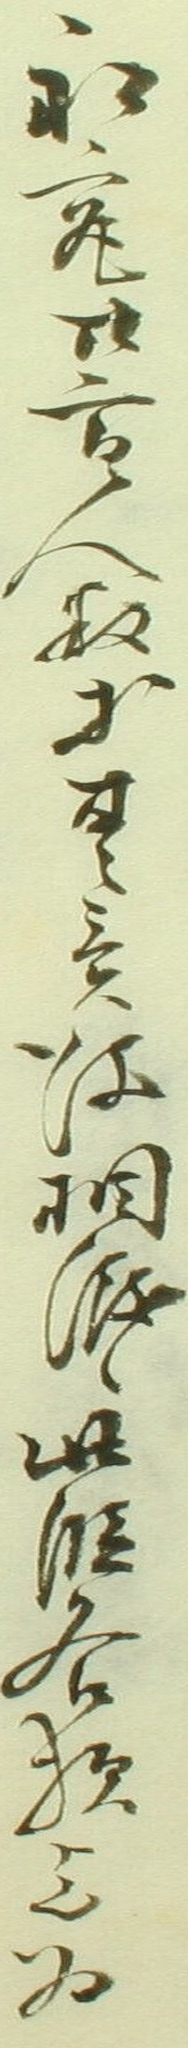船究廿二日人数等無異儀相渡候此段各様迄為
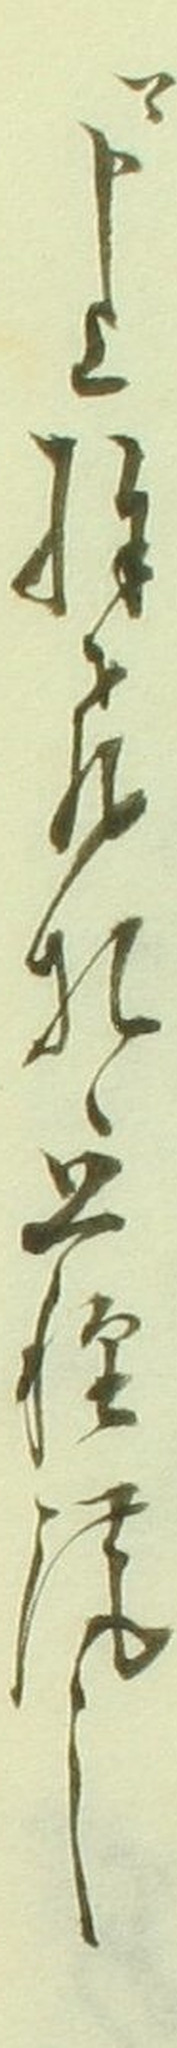可申上拝飛札候恐惶謹言
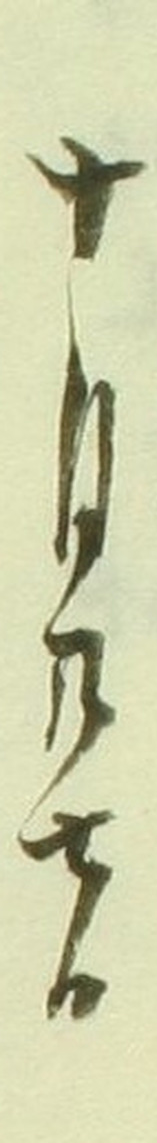十月廿七日
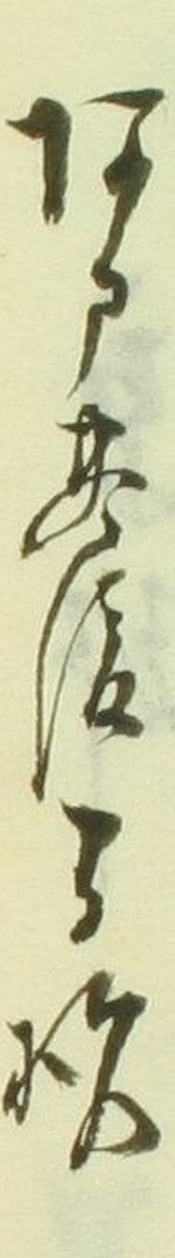阿部豊後守様
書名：異国船漂着記
